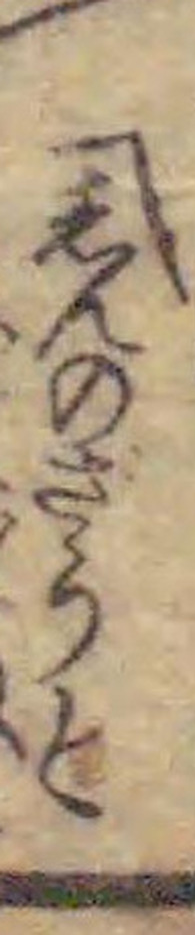〽しんのざうと
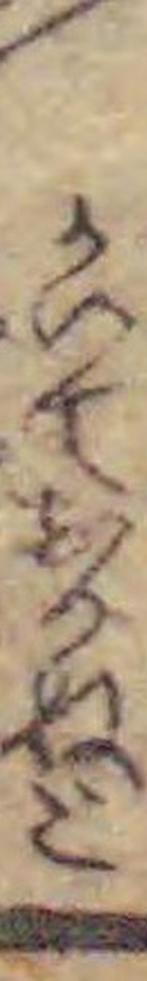かいておかぬと
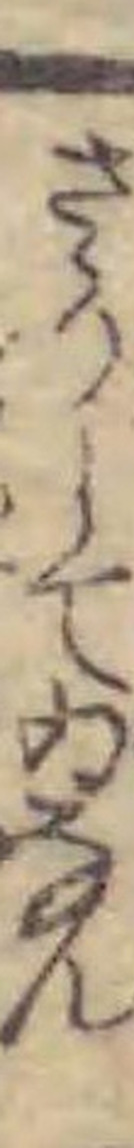さうしてゐなん
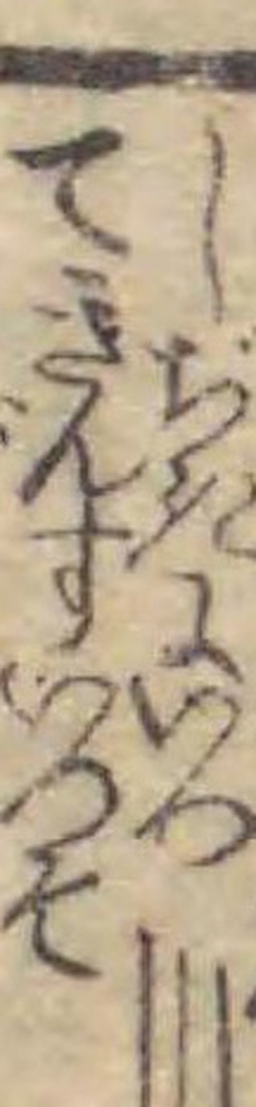てきんすいつそ
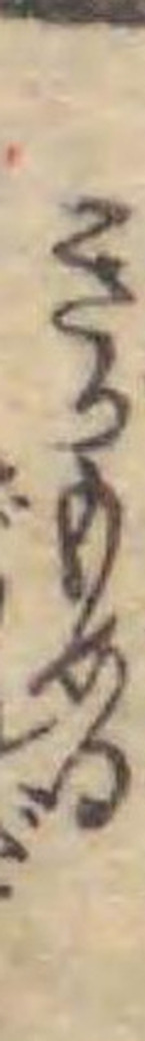きがもめる
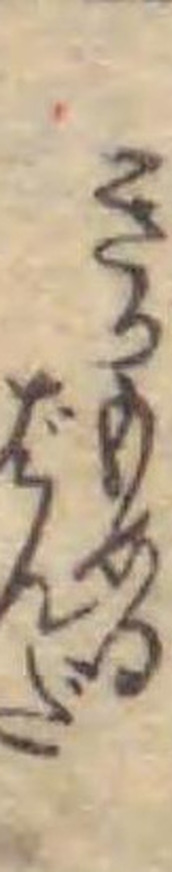きがもめる
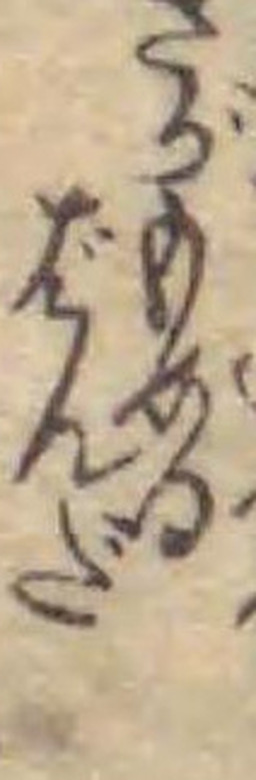ばんだ
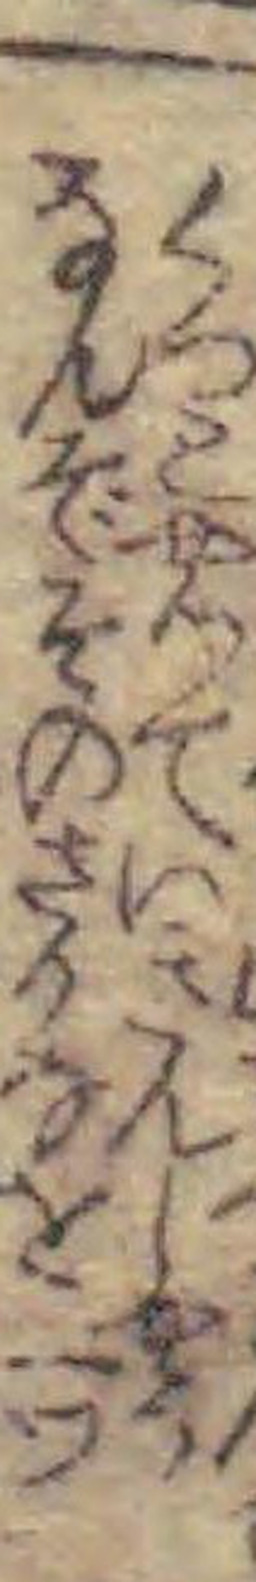なんぞそのさかなを一ツ
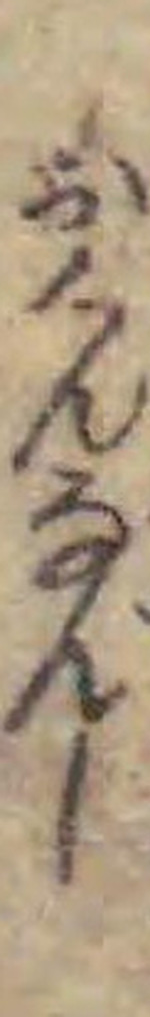おくんなんし
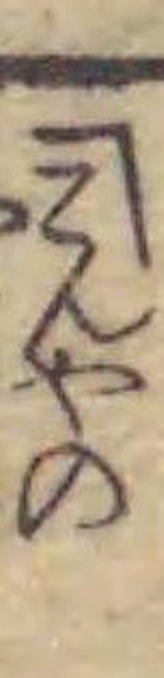〽こんやの
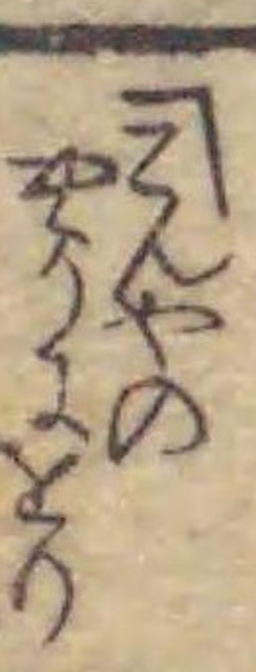やうにをり
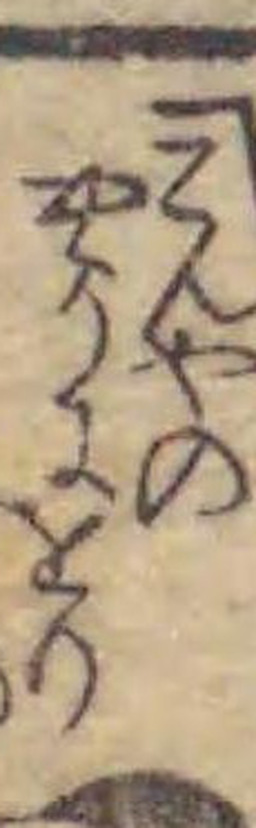やうにをり
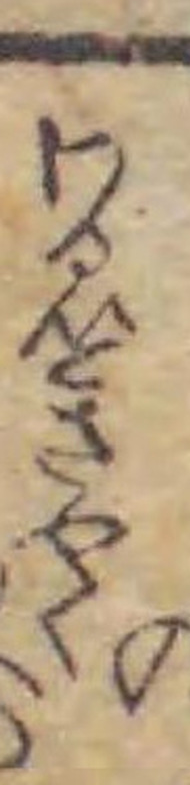わるいきやく
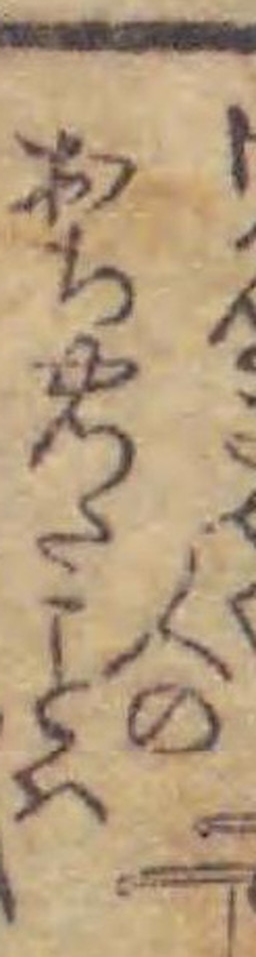おちやつたことは
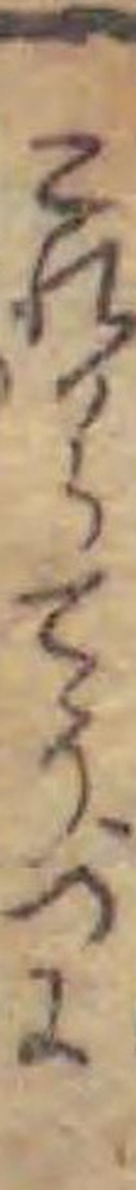これからてうづに
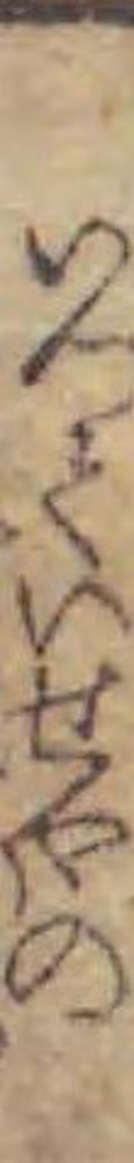いつていせやの
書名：十四傾城腹之内 : 3巻
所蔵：国立国会図書館 National Diet Library, JAPAN
